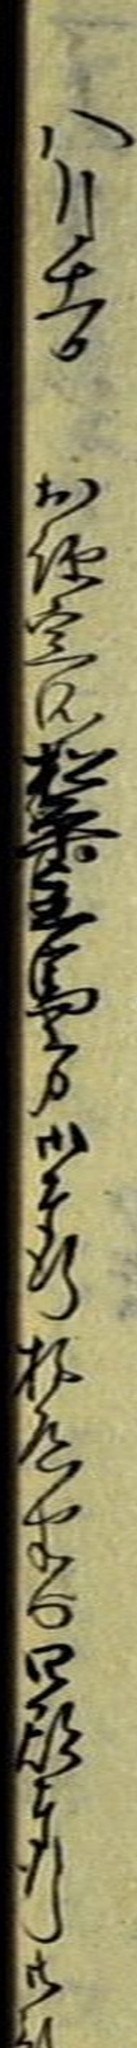八月十一日於評定所松平主馬方御奉行栃屋半右衛門四郡奉行御預所
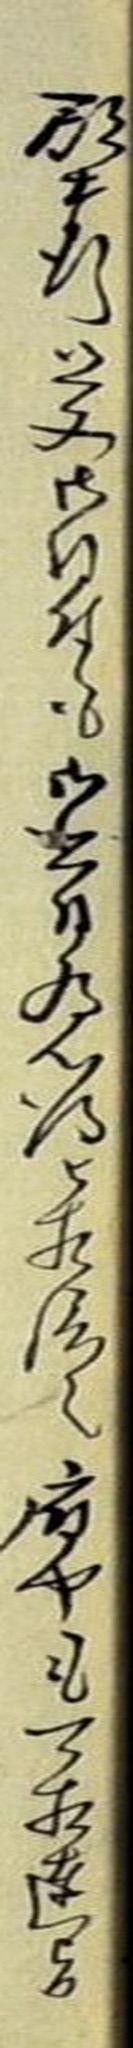郡奉行且又御目付へも御書付為心得被相渡之府中へも可相達旨
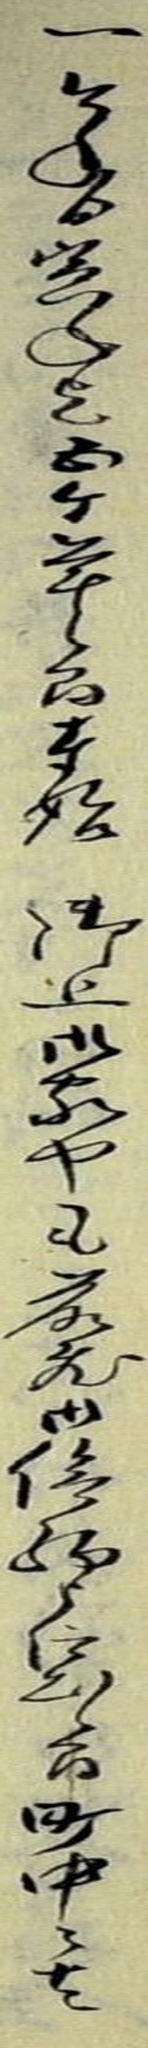一今年ゟ寅年迄五ケ年之間奉始御上御家中へも厳敷御倹約被仰出候間町中ニ者
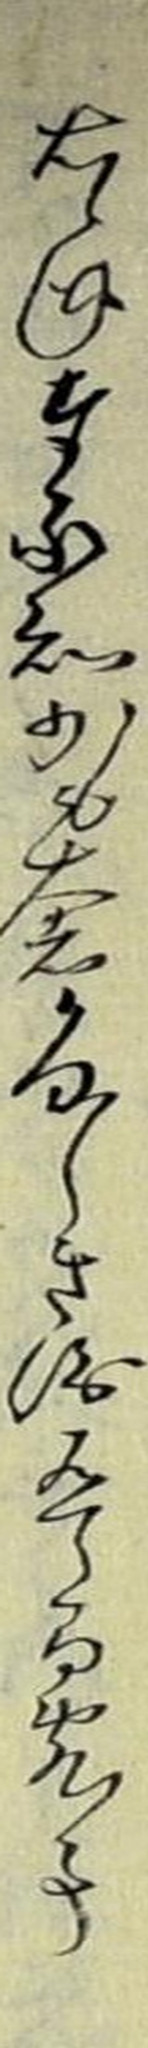右之趣奉承知少も奢かましき儀有之間敷事
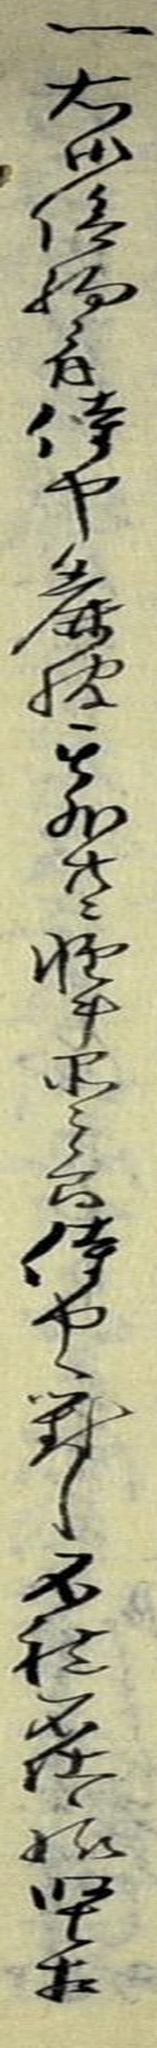一右御倹約ニ付侍中麁服其外共ニ軽キ品ニ候間侍中へ対し不礼不仕候様堅相
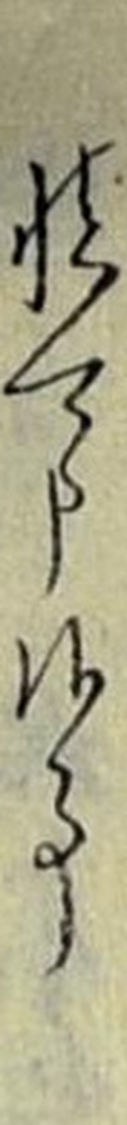慎可申候事
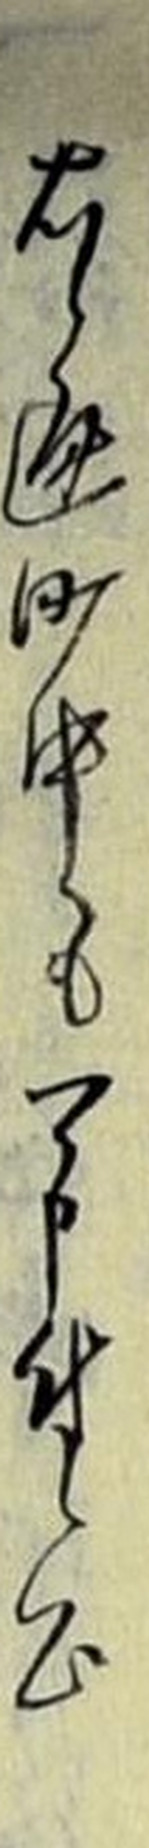右之通町中へも可申付候以上
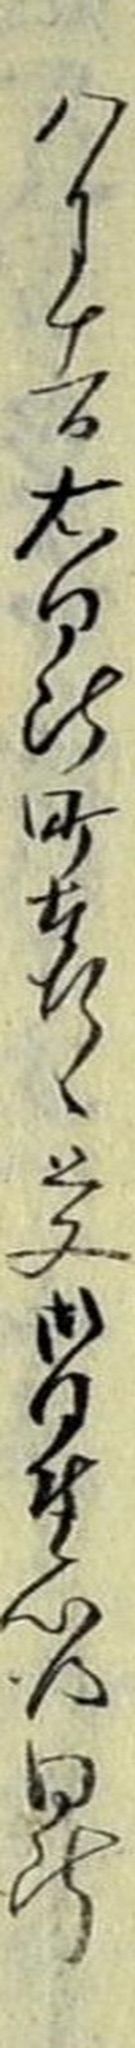八月十一日右同断町奉行へ且又御目付へ心得同断
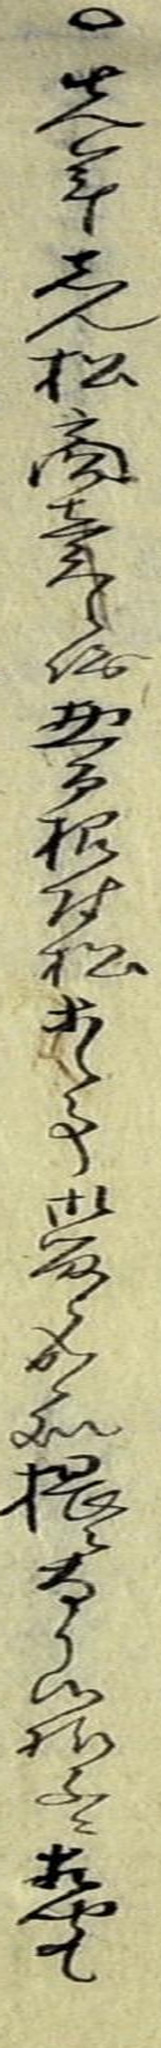〇先年しん松商売之儀惣而根付松等之事御留被成候処猥ニなり候様子ニ相聞候
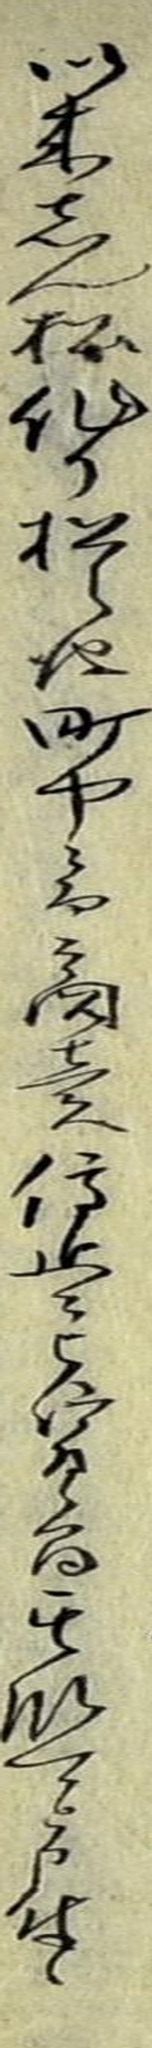以来しん松作り松之儀町中ニ而商売停止ニ被仰付候間其段可被申付候
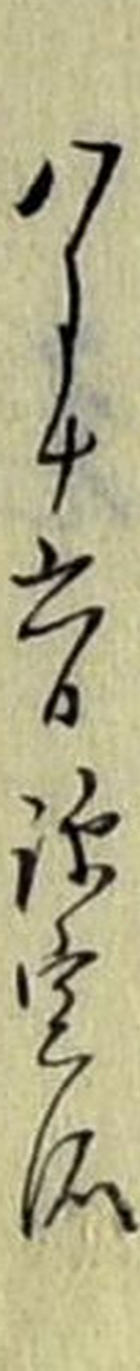八月十六日評定所
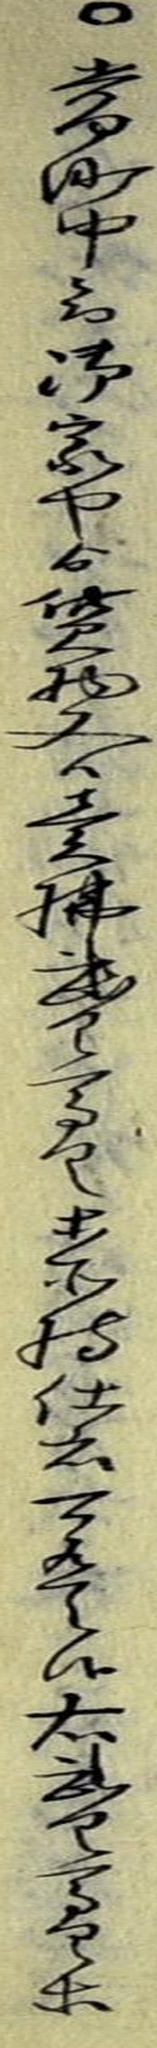〇当町中ニ而御家中ゟ質物又ハ売払武具馬具等所持仕者可有之候右武具馬具等

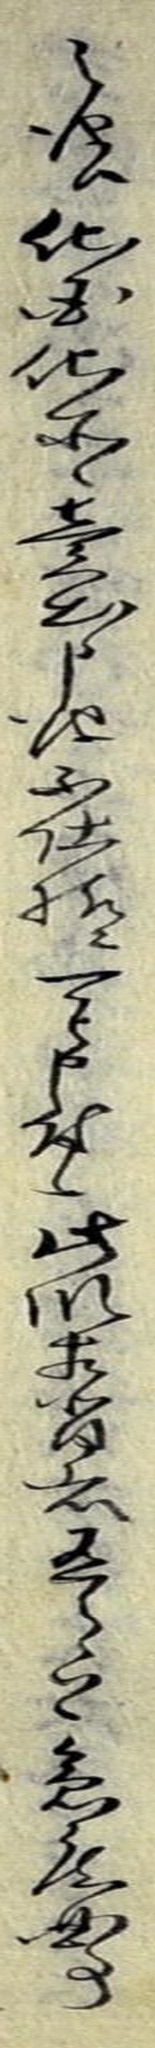之儀ハ他国他所へ売出申儀不仕様ニ可被申付候此段相背者有之候ハヽ急度曲事
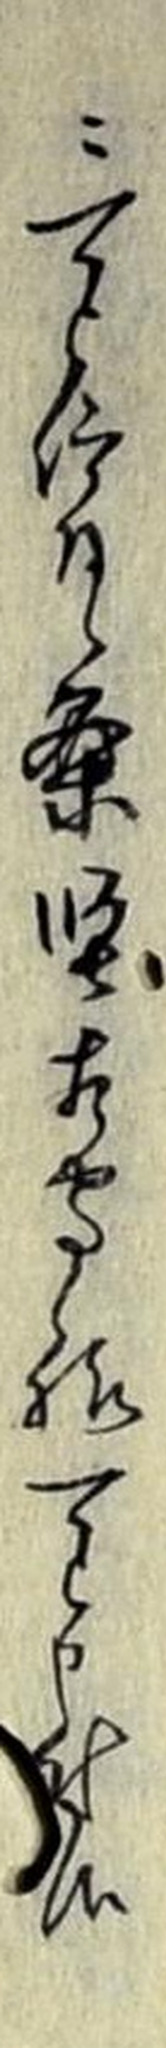ニ可被仰付候条堅相守候様可被申付候
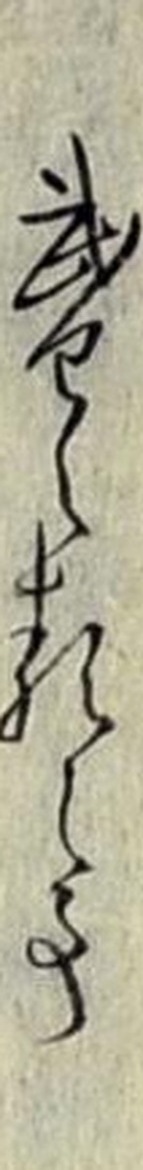武具之類之事
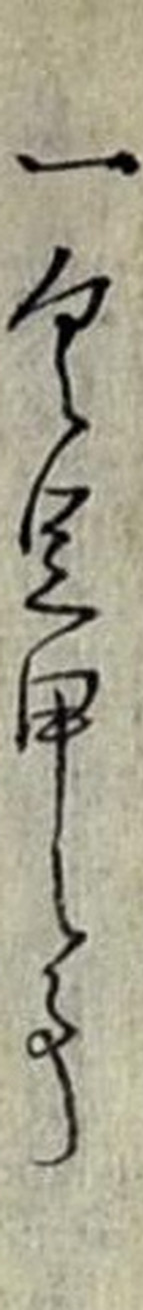一具足甲之事
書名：命令之部 一
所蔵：福井県文書館 Fukui Prefectural Archives
